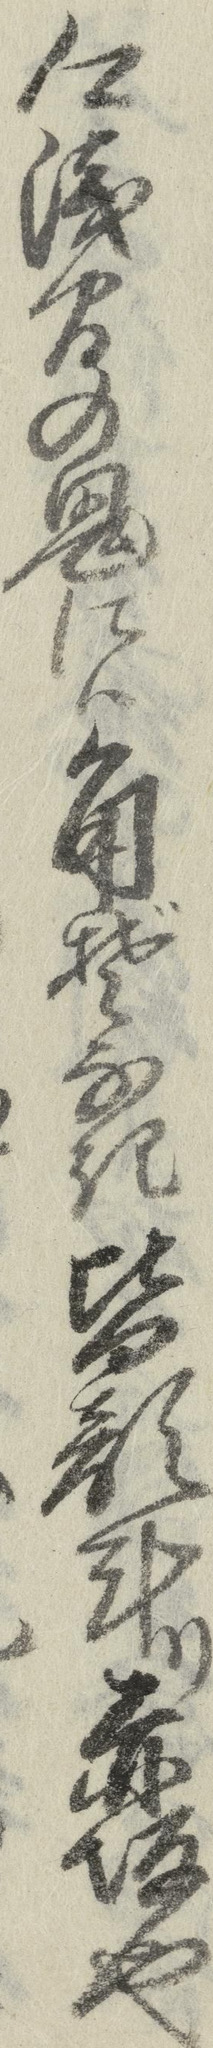郷浅間の鬼には角ぞなき皆顔計り赤坂や
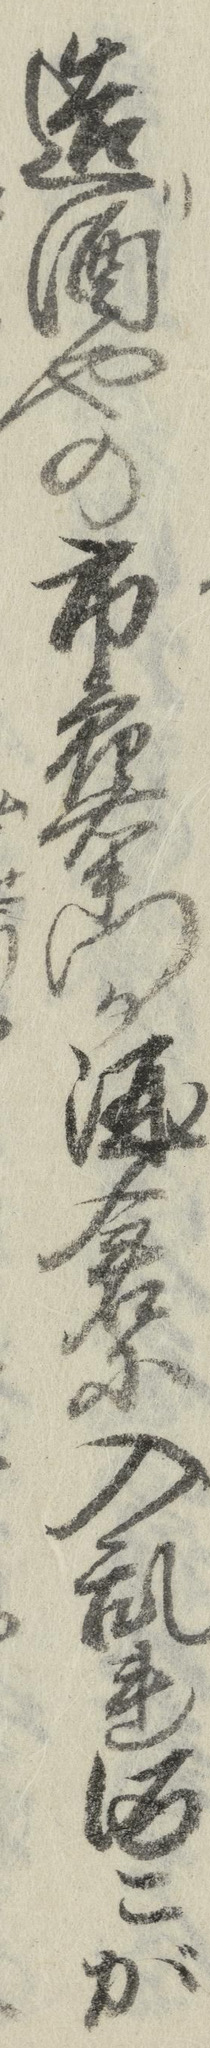造り酒やの市郎右衛門か酒倉に入乱れ酒こが
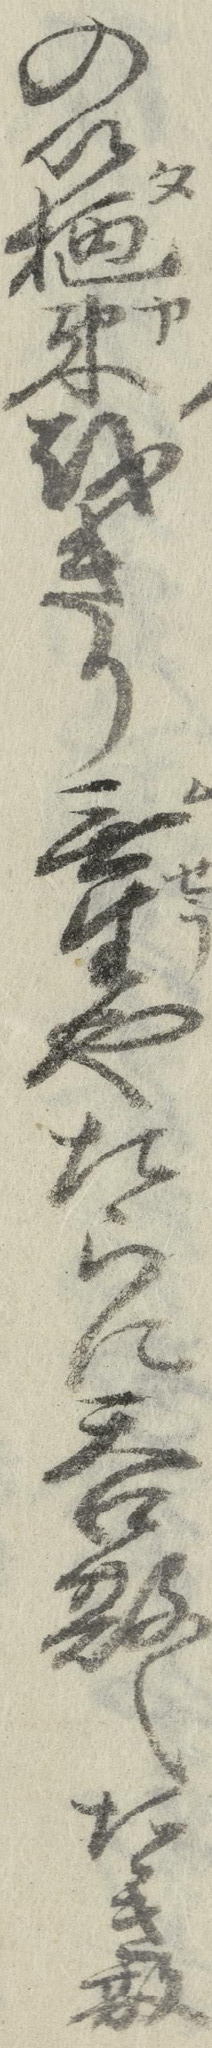の箍成をきり無生やたらに呑散したゝき散
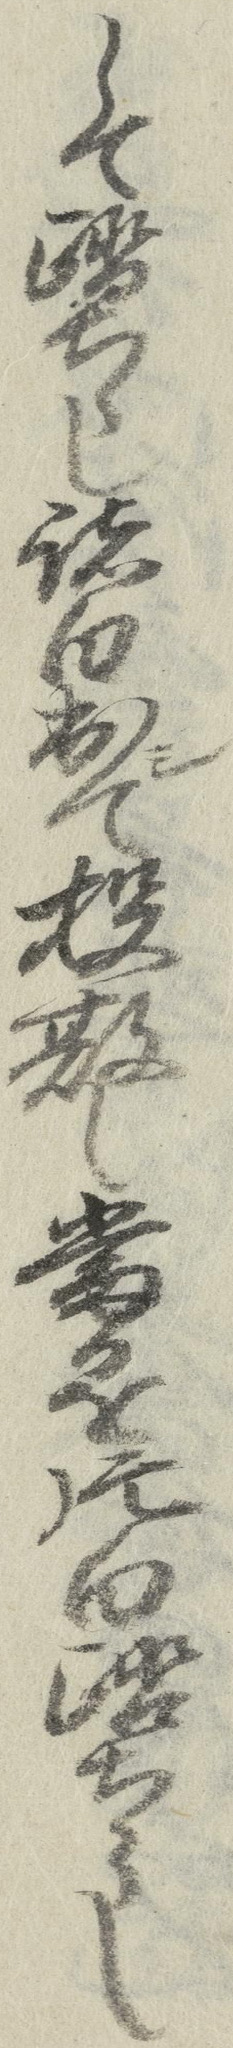して踏ちらし諸白出投散し当懸片白踏ちらし
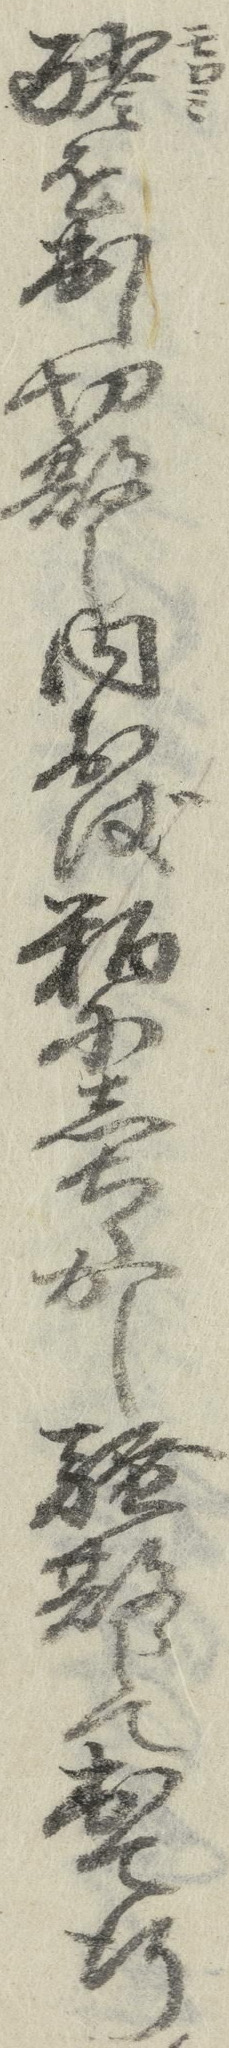醪を出し切散し内おば粕にしちらかし騒散らして出て行
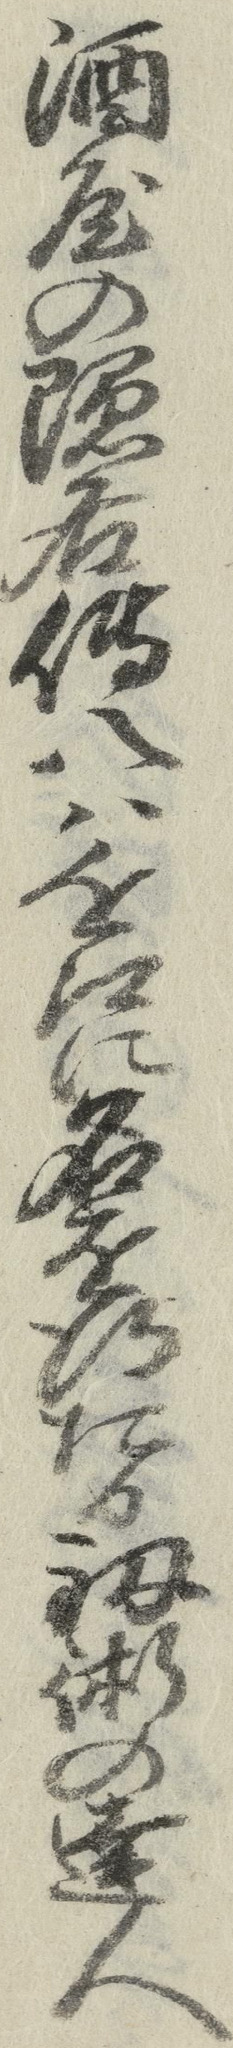酒屋の隠居伝八は近江に名を得たる釼術の達人
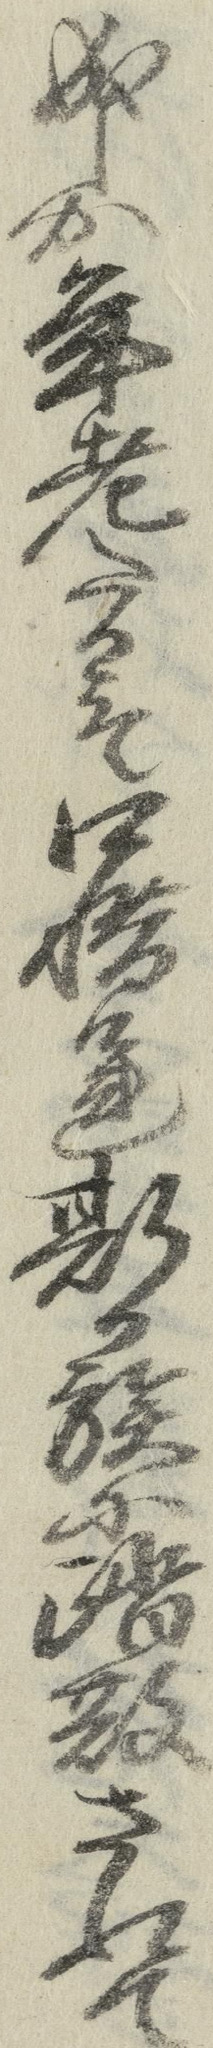成しか年老たるそ口惜けれ斯る族に踏散されて

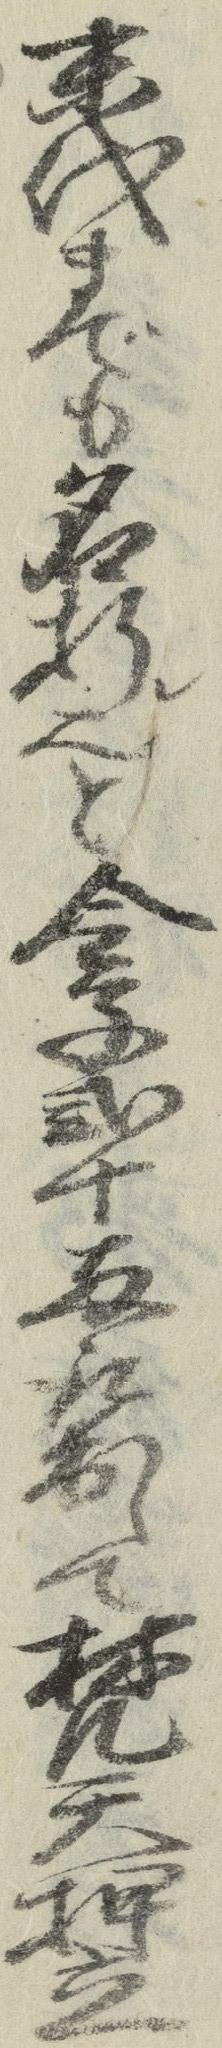末代までも名折也と金子弐十両取出して梵天押立
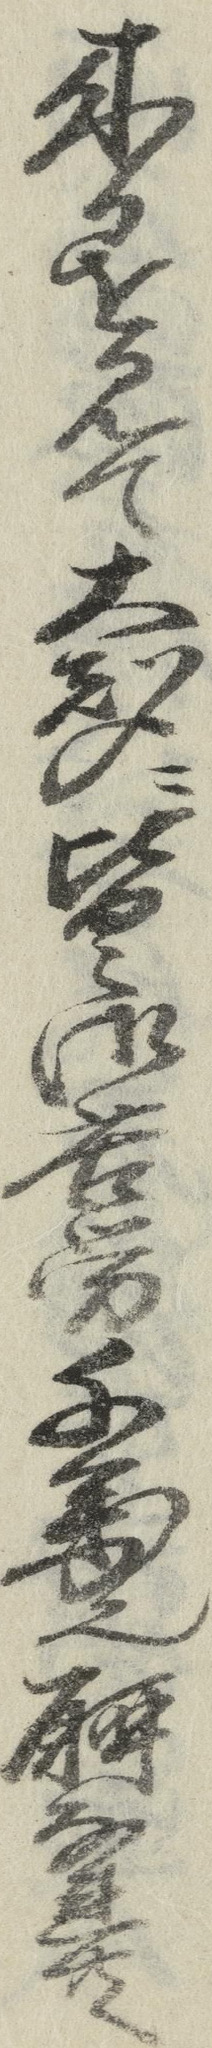来るを見て大声に皆々御苦労千萬也聊なれ共
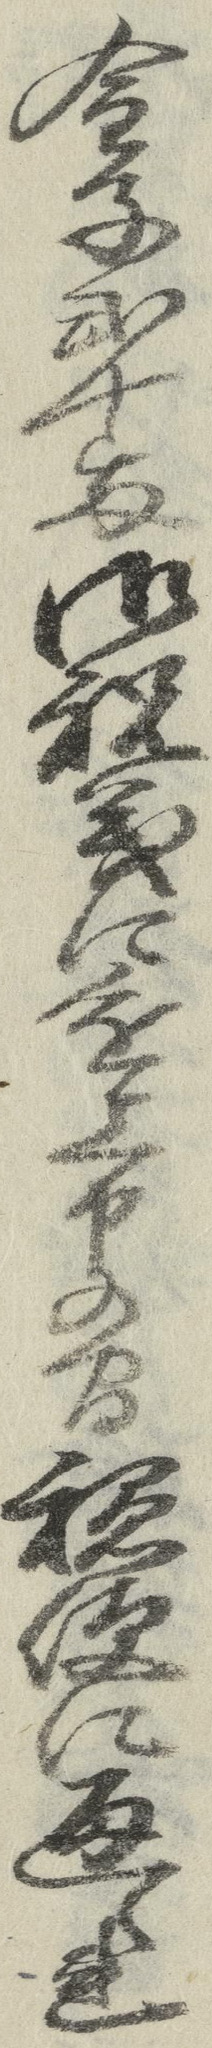金子弐十両御祝義に進上申の間穏便に返られ
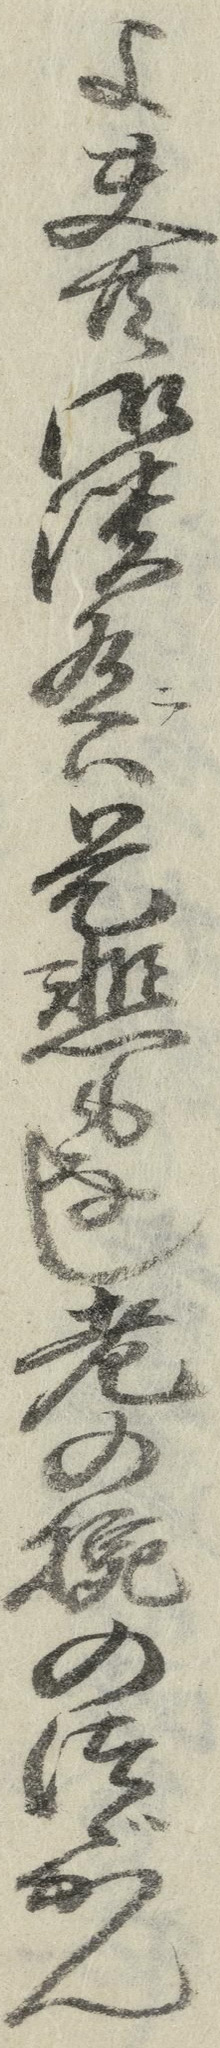よ夫共御潰有是悲もなし老の腕のつゞかん
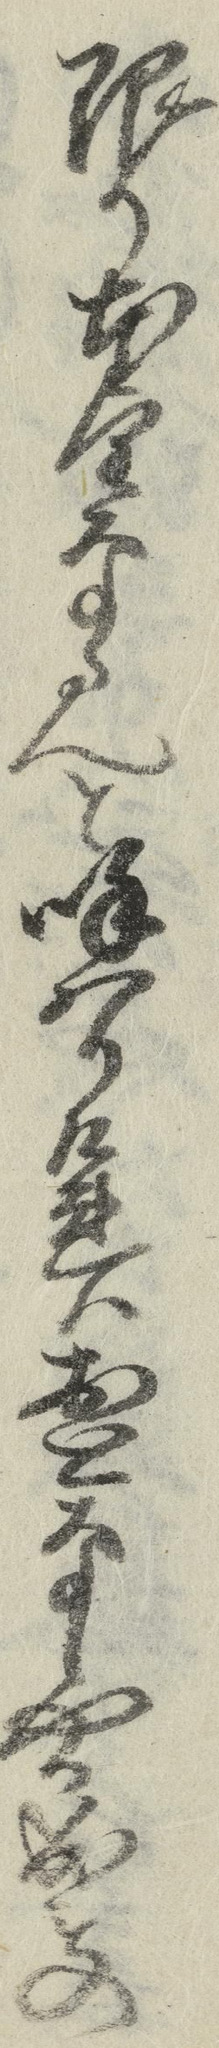限り本望ならんと呼はりけれはおとなしやか成もの
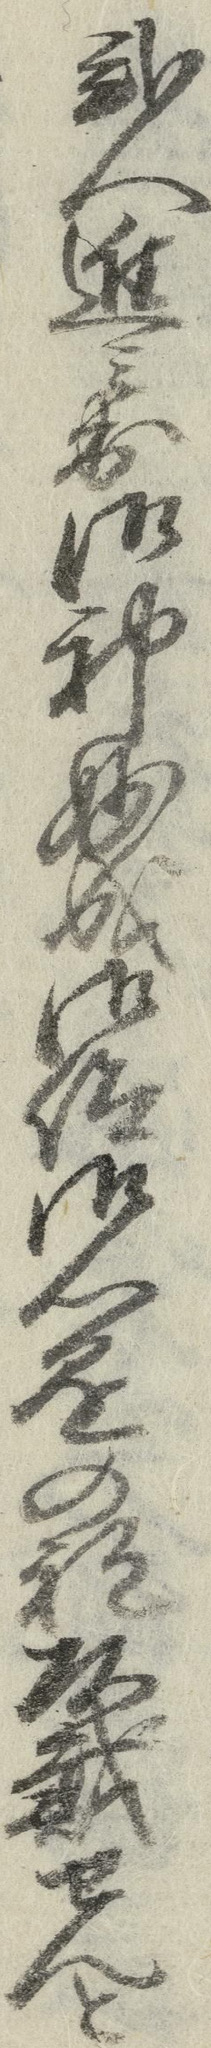弐人進み出御神妙成御仰御心懸の程頂戴せんと
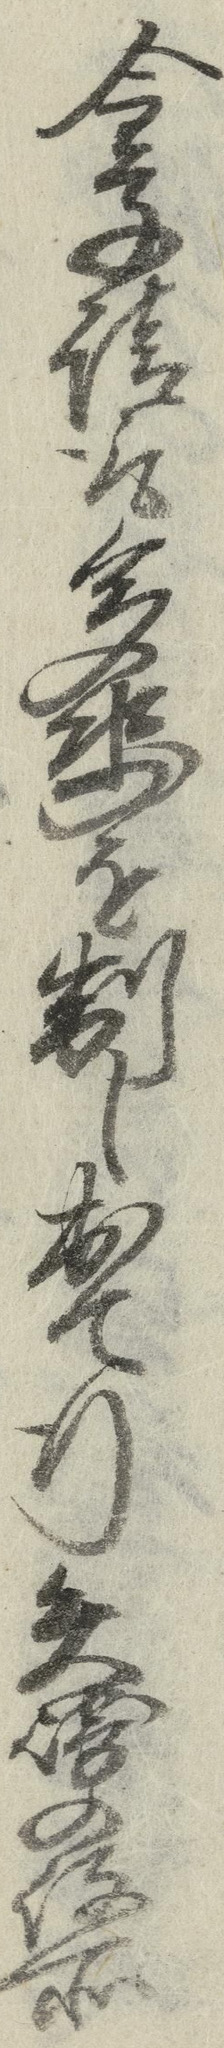金子請取多決を制し出て行矢嶋の役所
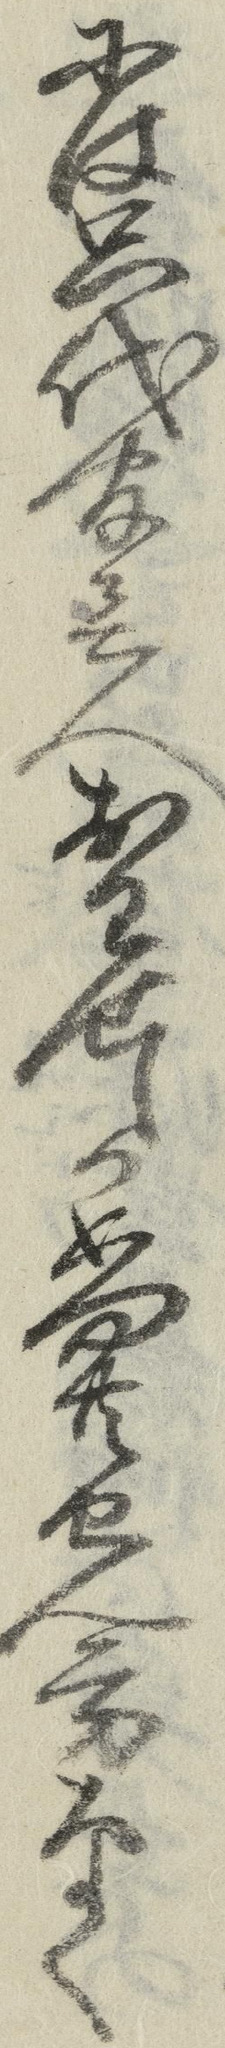には只代官壱人おわせしか如何共セん方なく
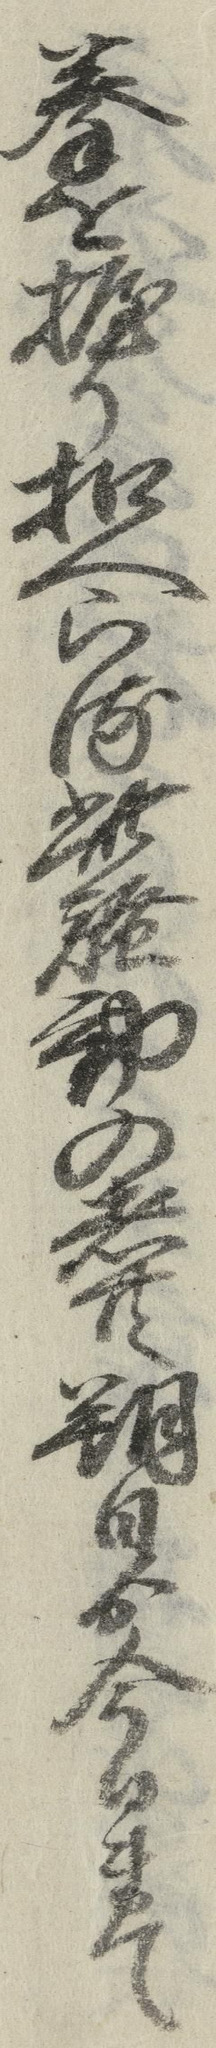拳を握り扣へらる此騒動の者共朔日ゟ今日まて
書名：浅間大焼騒動記　下
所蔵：東京大学地震研究所図書室 Earthquake Research Institute Library, The University of Tokyo, JAPAN
